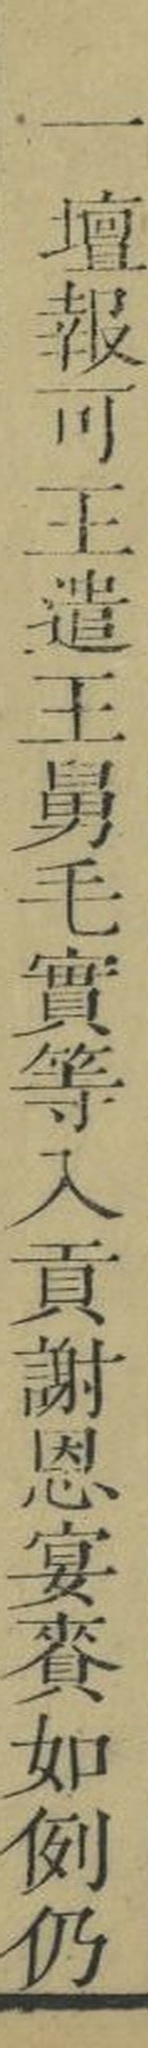一壇報可王遣王舅毛実等入貢謝恩宴賚如例仍
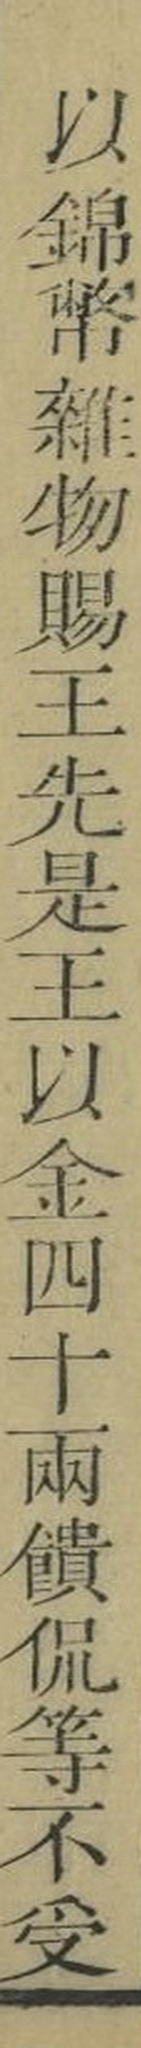以錦幣雑物賜王先是王以金四十両饋侃等不受
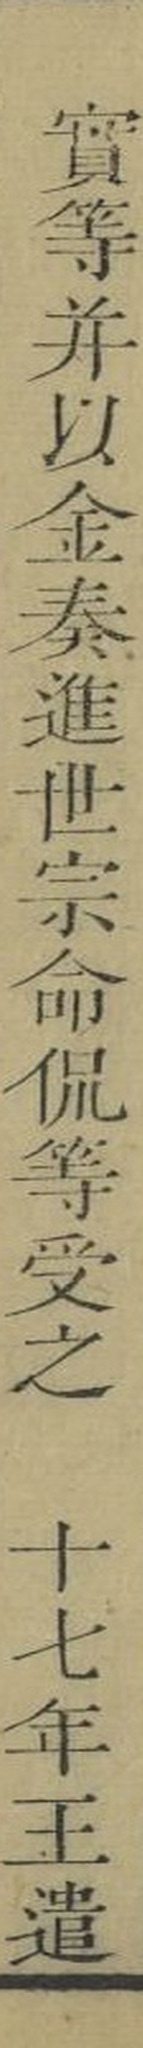実等并以金奏進世宗命侃等受之十七年王遣
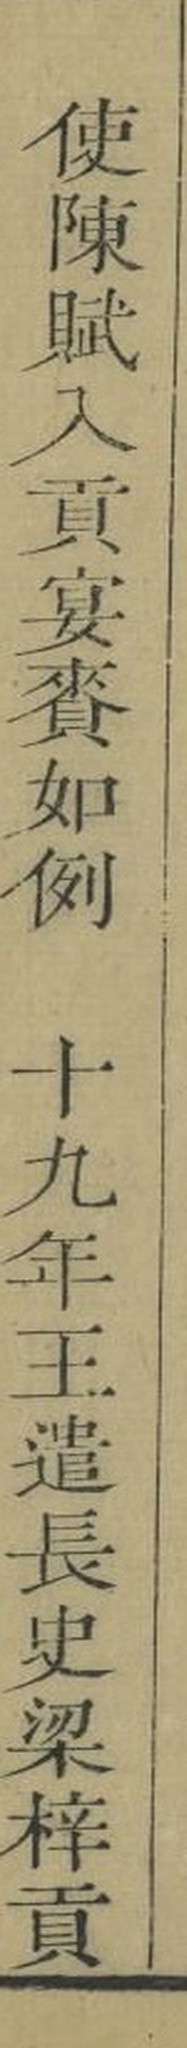使陳賦入貢宴賚如例十九年王遣長史梁梓貢
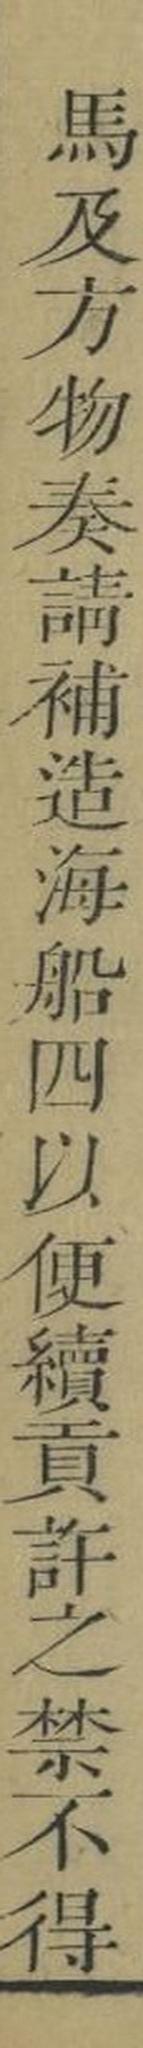馬及方物奏請補造海船四以便続貢許之禁不得

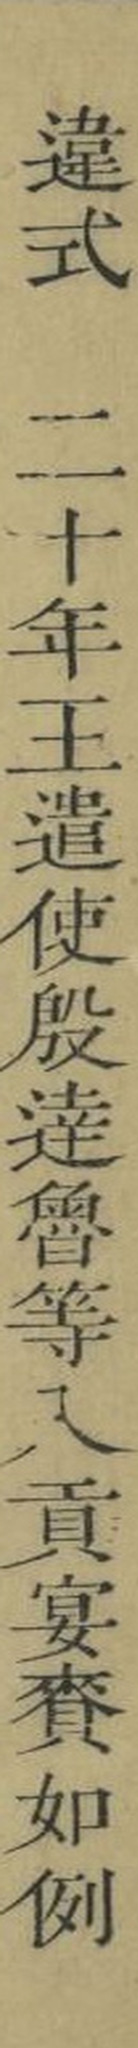違式二十年王遣使殷達魯等入貢宴賚如例
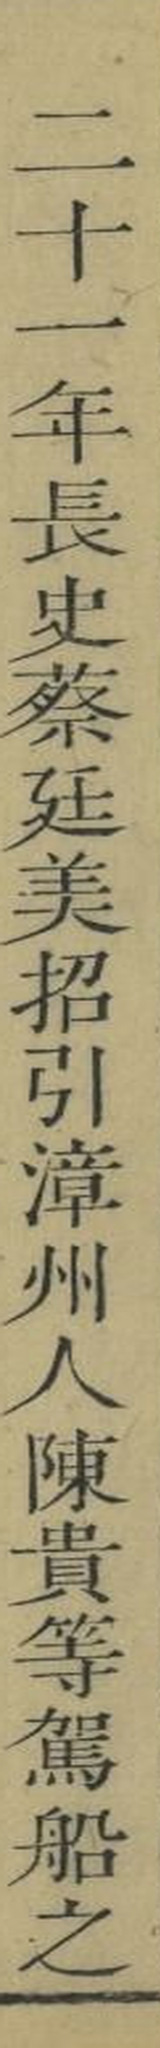二十一年長史蔡廷美招引漳州人陳貴等駕船之
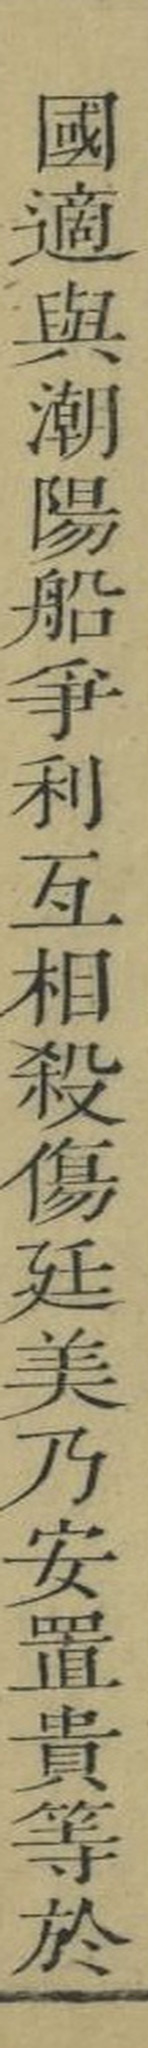国適与潮陽船争利互相殺傷廷美乃安置貴等於
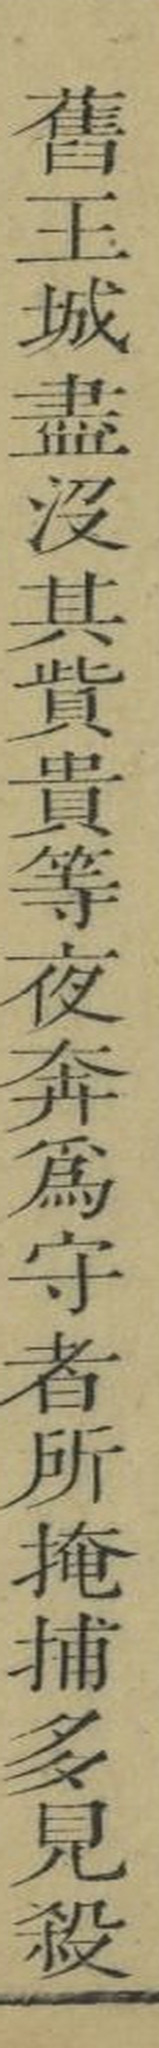旧王城尽没其貲貴等夜奔為守者所掩捕多見殺
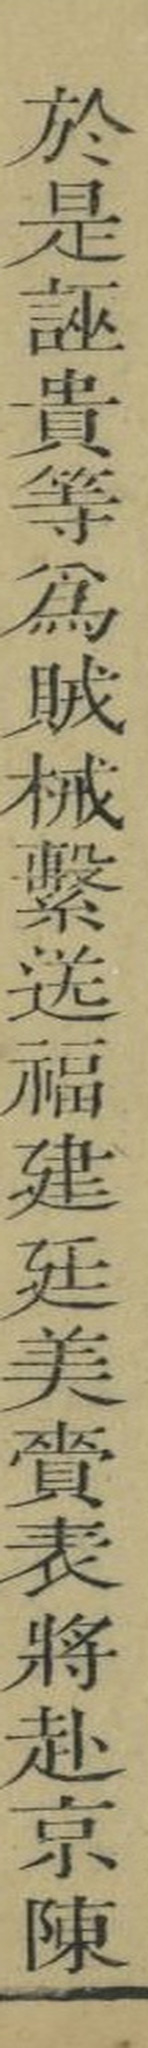於是誣貴等為賊械繋送福建廷美賚表将赴京陳
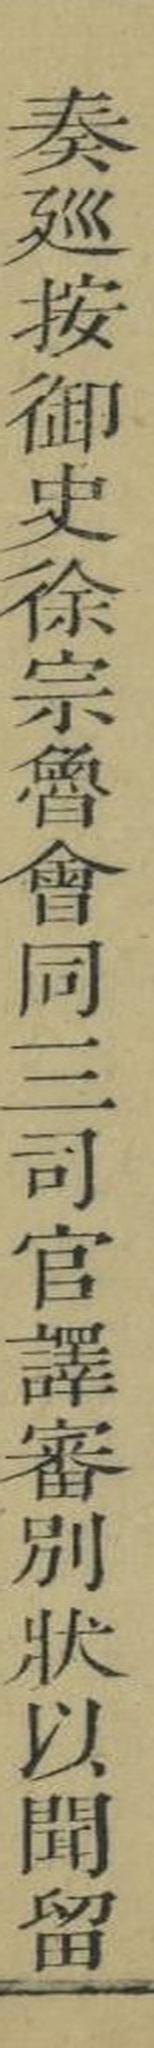奏巡按御史徐宗魯会同三司官訳審別状以聞留
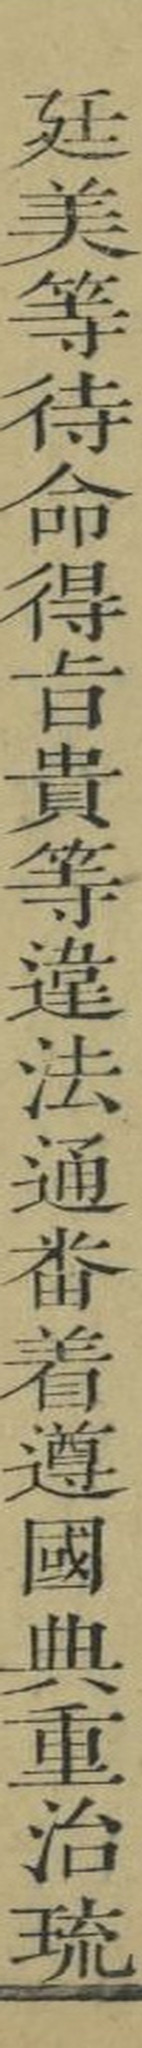廷美等待命得旨貴等違法通畨着遵国典重治琉
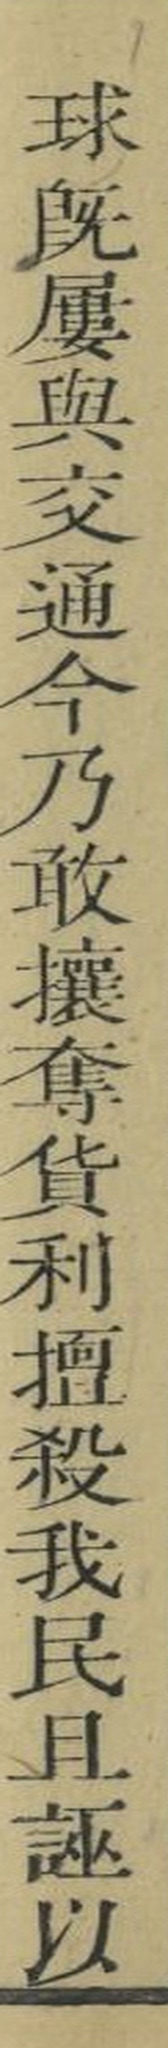球既屢与交通今乃敢攘奪貨利擅殺我民且誣以
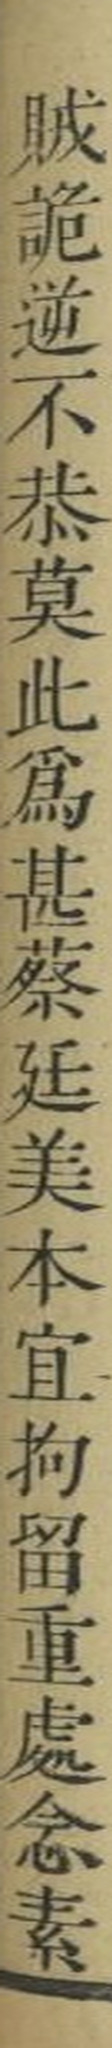賊詭逆不恭莫此為甚蔡廷美本宜拘留重処念素
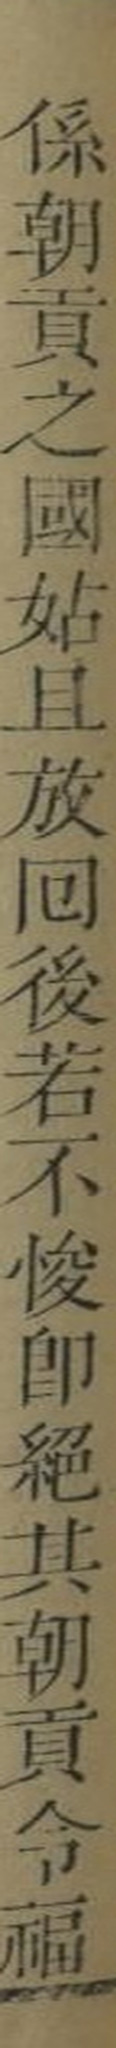係朝貢之国㚲且放回後若不悛即絶其朝貢令福
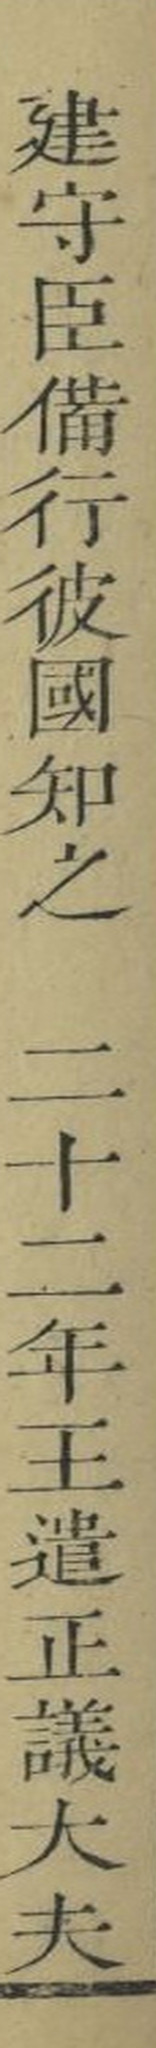建守臣備行彼国知之二十二年王遣正議大夫
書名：中山伝信録 巻三
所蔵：University of the Ryukyus Library
